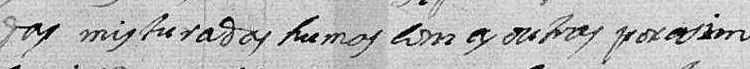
das misturadas humas com as outras por asim
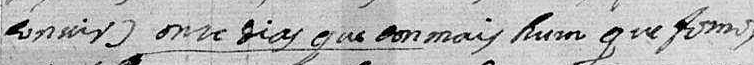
conuir) onze dias que con mais hum que fomos
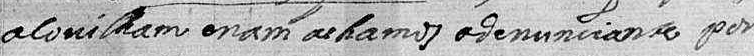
a Couilham e nam achamos a denunciante por
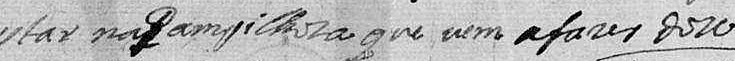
estar na Pampilhoza que uem a fazer doze
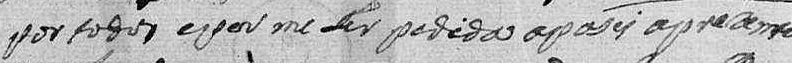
por todos e por me ser pedida a pasei a prezemte
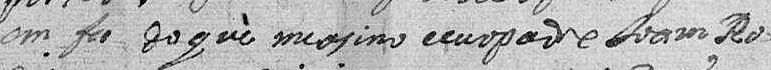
em fee do que me asino e eu o padre Ioam Ro
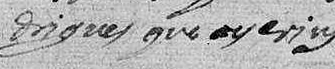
drigues que o escriuj
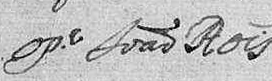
o p.e Ioaõ Rois̄
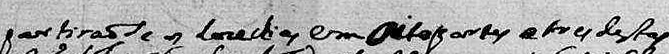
partiraõse os doze dias em oito partes e tres destas
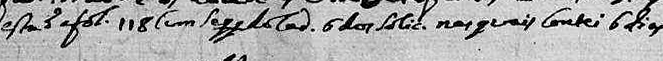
estaõ a fol. 118 Comseqq do Cad. 6 dos solic. nas quais Contei 6 dias
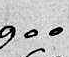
900
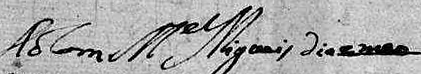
Ao Com Mel Migueis dia e meo
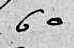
60
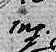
inq.
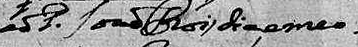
ao P. joaõ Roīs dia, e meo
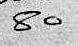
80
